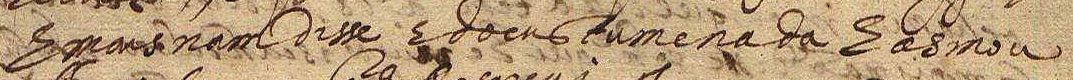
E mais nam disse E do custume nada E asinou
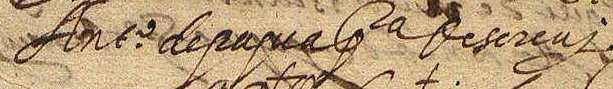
Ant.o de pajua pra O escreuj
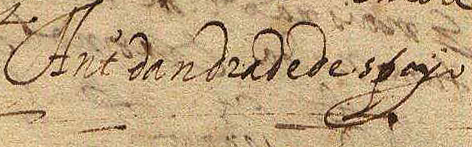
Anto dandrade de spayo
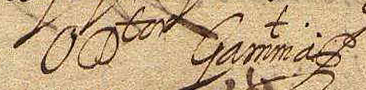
O Dtor Gamma
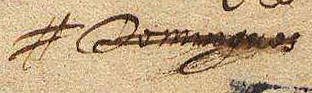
Dominguos
